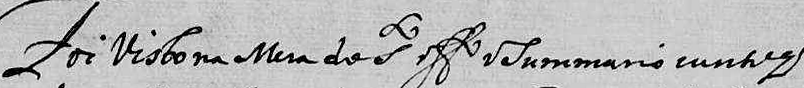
Foi Visto na Meza do sto offo o Summario iunto q̄
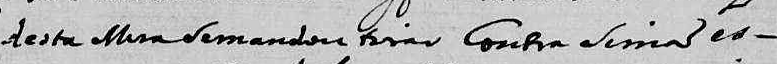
desta Meza se mandou tirar Contra Simaõ es
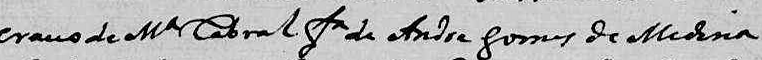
crauo de Ma Cabral fa de Andre gomes de Medina
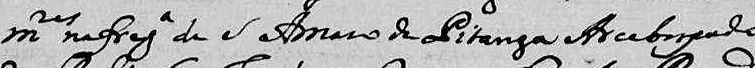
mres na frega de S Amaro de Pitanga Arcebispado
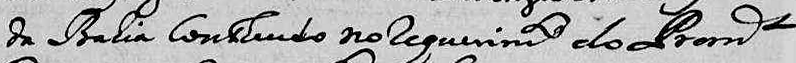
da Bahia Contheudo no Requerimto do Promor
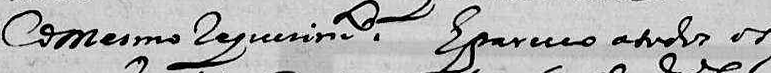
E o mesmo Requerimto. E pareceo a todos os
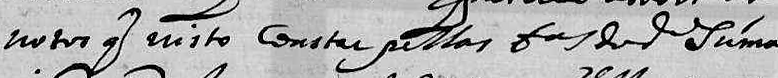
uotos q̄ uisto constar pellas tas do do Sum̄a
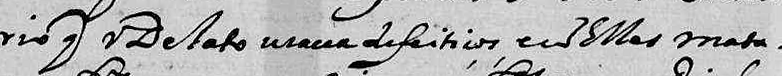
rio q̄ o Delato uzaua de feitiços, e cō Elles mata
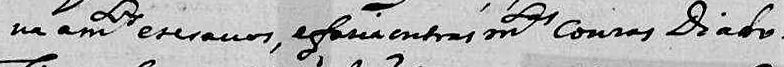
ua a mtos escrauos, e fazia outras mtas couzas Diabo
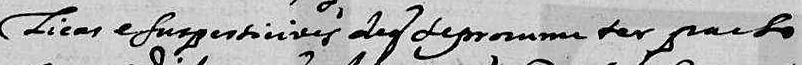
Licas e susperticioes̄ de q̄ se prezume ter pacto
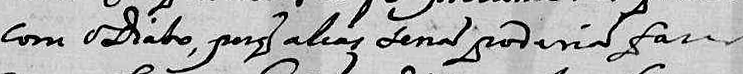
com o Diabo, porq̄ alias se nā poderiā fazer
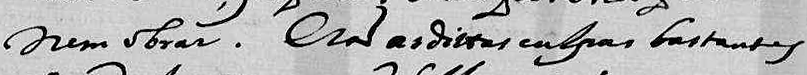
nem obrar. E saõ as dittas culpas bastantes
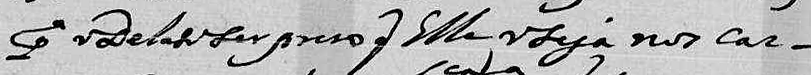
pa o Delato ser preso q̄ Elle o seja nos car
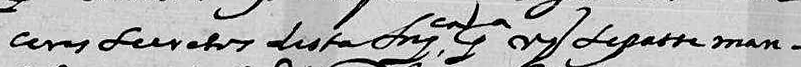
ceres secretos desta Inqçā, pa o q̄ se passe man
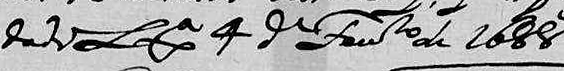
dado Lxa 4 de Feuro de 1688
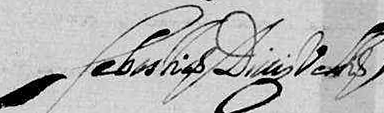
Sebastiaõ Dinis Velho
